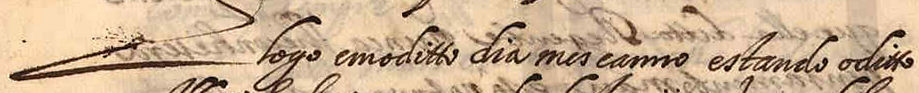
E logo em o ditto dia mes e anno estando o ditto
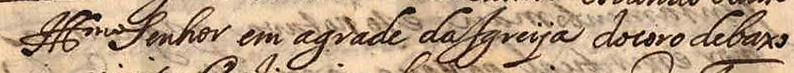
Ill.mo Senhor em a grade da Jgreija do coro de baxo
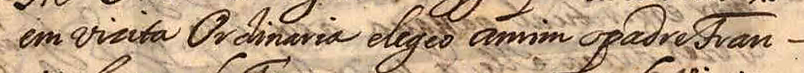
em vizita Ordinaria elegeo a mim o padre Fran
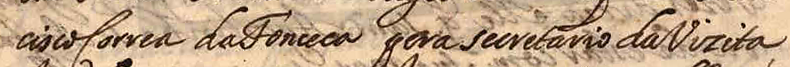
cisco Correa da Fonceca pera secretario da Vizita,
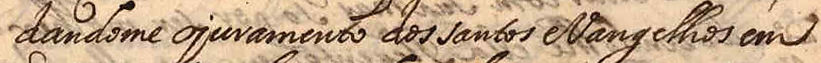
dandome o juramento dos santos eVangelhos em
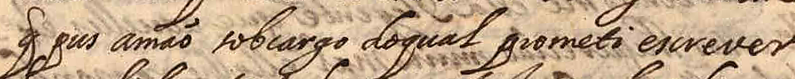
q̄ pus a maõ sob cargo do qual prometi escrever
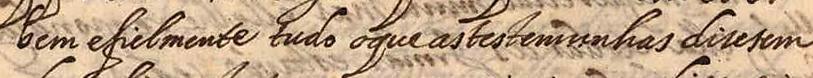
bem e fielmente tudo o que as testemunhas disesem
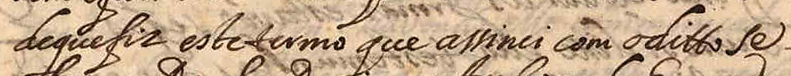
de que fiz este termo que assinei com o ditto se
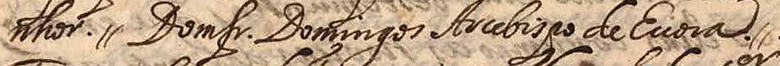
nhor. // Dom fr. Domingos Arcebispo de Euora.//
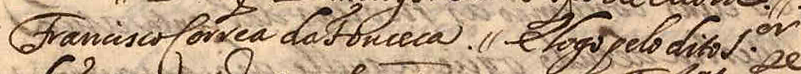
Francisco Correa da Fonceca.// E logo pelo dito S.or
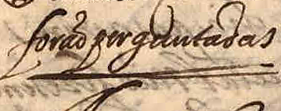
foraõ perguntadas
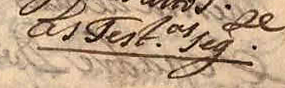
as Test.as seg.te
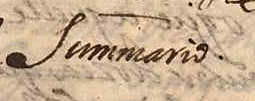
Summario.
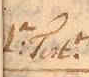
1:a Testa.
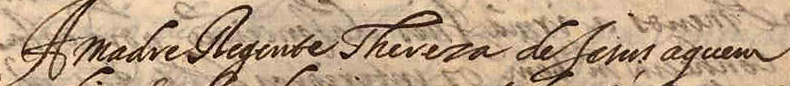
A madre Regente Thereza de Jesus, a quem
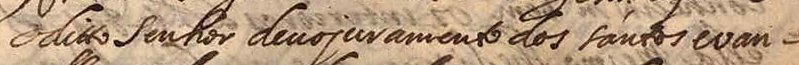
o ditto Senhor deu o juramento dos santos evan
